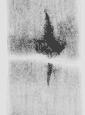十
